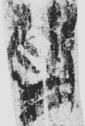爲
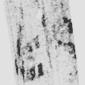亡（無）
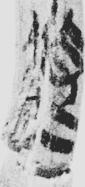道
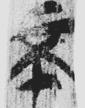不
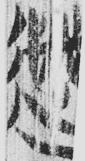○（遷）
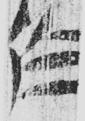於
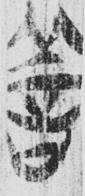善
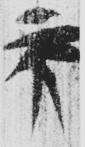而
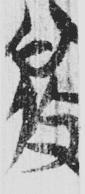敓（奪）
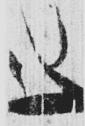之
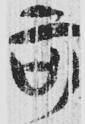可
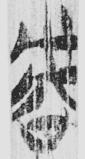唬（乎）
